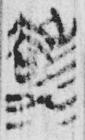灋
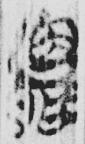○（盈）
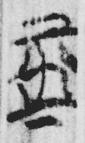亞（惡）
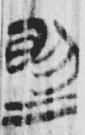則（則）
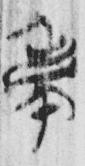民
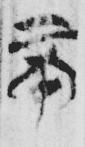不
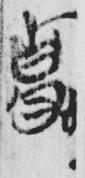惋（怨）
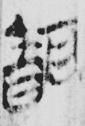䎽（聞）
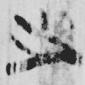之
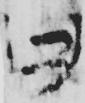曰
